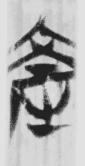產
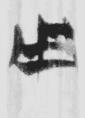用
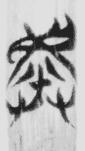{民𠔉}
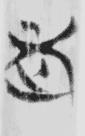老
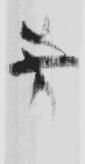先
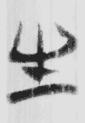生
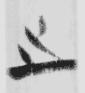之
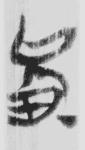{田允}
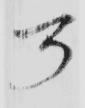乃
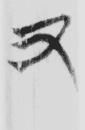又
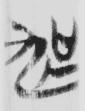喪
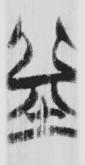{丘土}
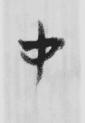中
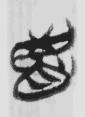{皿目彡}
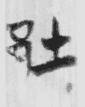{土阝}
